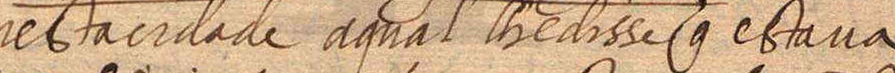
nesta cidade a qual lhe disse q̅ estaua
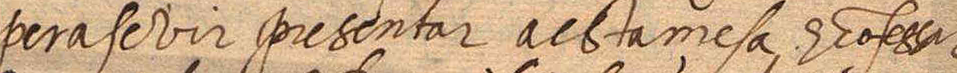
pera se vir presentar a esta mesa E co̅fessar
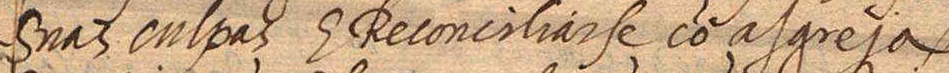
suas culpas E Reconciliarse co̅ a Jgreja
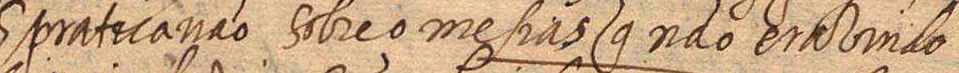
E praticauão sobre o messias q̅ não era vindo
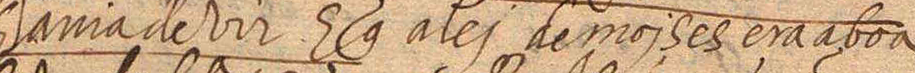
E auia de vir E q̅ a lej de mojses era a boa
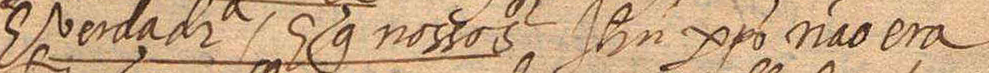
E verdadra / E q̅ nosso sor Jhu̅ xpo̅ não era
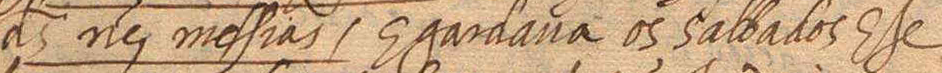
d̅s ne̅ messias / E gardaua os sabbados E je
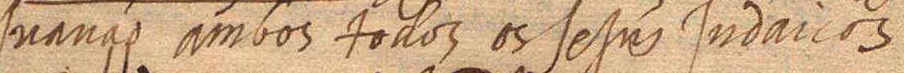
Juauão ambos todos os Jeju̅s Judaicos
